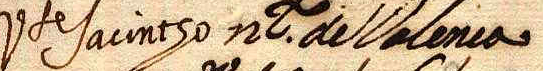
Vte Jacintho nt.o de Valença
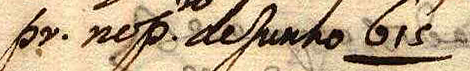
pr. no p.ro de Junho 615
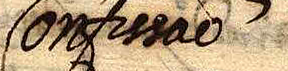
Confissaõ
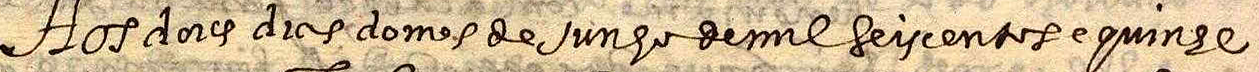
Aos dous dias do mes de Junho de mil seiscentos e quinze
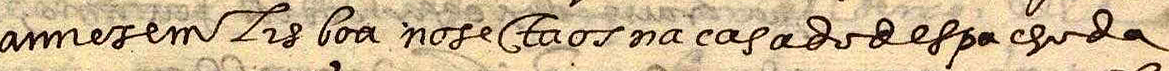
annos em Lisboa nos estaos na casa do despacho da
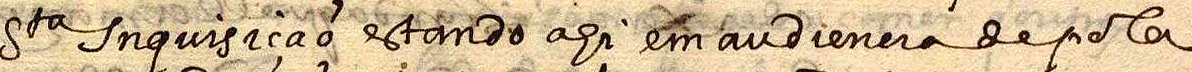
Sta Inquisiçaõ estando ahi em audiencia de pola
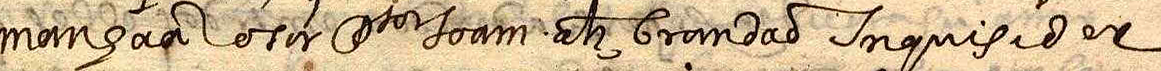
manhaã o sōr Dtor Ioam al̄z brandaõ Inquisidor
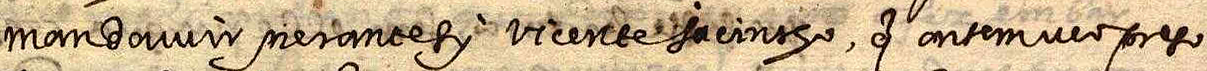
mandou uir perante sy vicente jacintho, q̄ ontem ueo preso
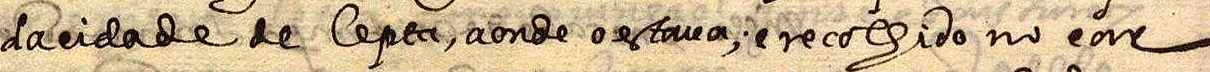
da cidade de Cepta, aonde o estaua; e recolhido no car
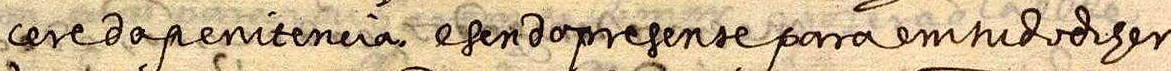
cere da penitencia e sendo presente para em tudo dizer
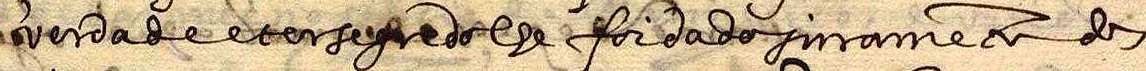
verdade e ter segredo lhe foi dado juramēto dos
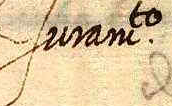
Juram.to
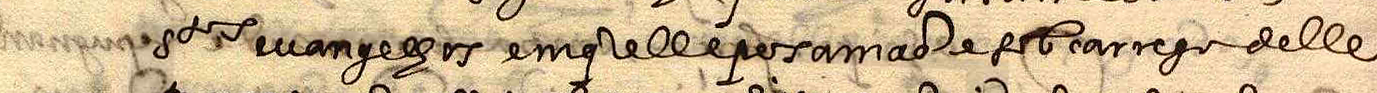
stos euangelhos em q̄ elle pos a maõ e sob carrego delle
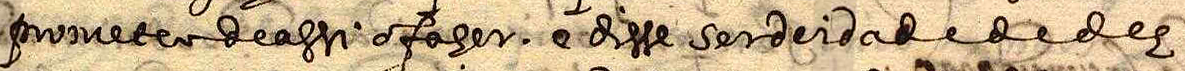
prometeo de assi o fazer. e disse ser de idade de dez
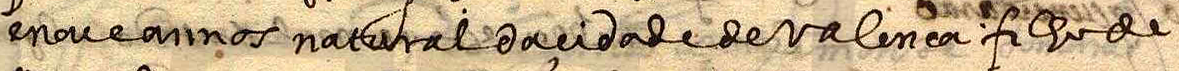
anoue annos natural da cidade de valença filho de
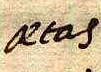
ætas
